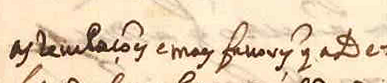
as Reuelações, e mais fauores q̄ a De
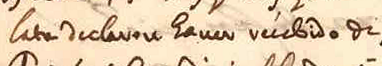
lata declarou hauer recebido de
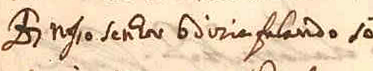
Ds̄ nosso senhor o dizia falando só
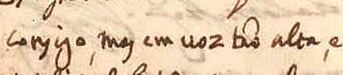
consigo, mas em uoz taõ alta, e
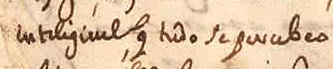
intelligiuel, q̄ tudo se percebeo
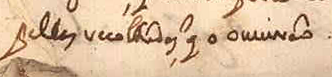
pellas recolhidas, q̄ o ouuirão.
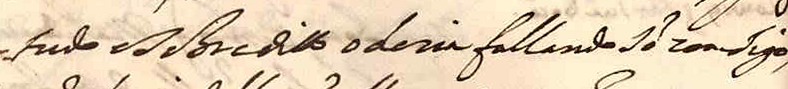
tudo o sobreditto o dizia fallando só comsigo,
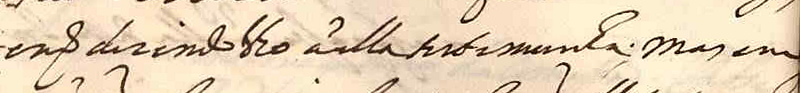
e naõ dizendo lho á ella testemunha; mas em
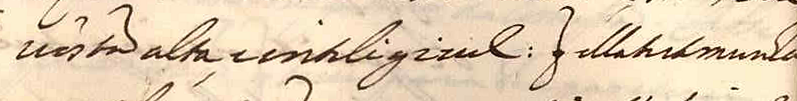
uós taõ alta, e inteligiuel: q̄ ella testemunha
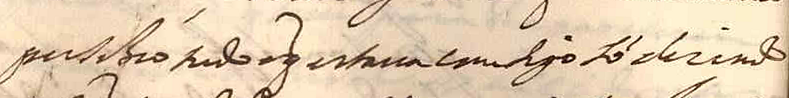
persebeo tudo o q̄ estaua comsigo só dizendo
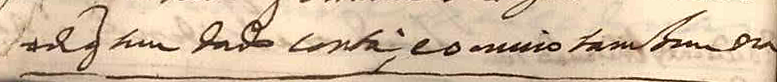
e de q̄ tem dado conta, e o ouuio tambem na
